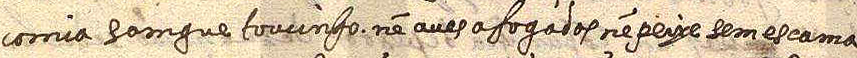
comia samgue toucinho. nē aues afogadas nē peixe sem escama
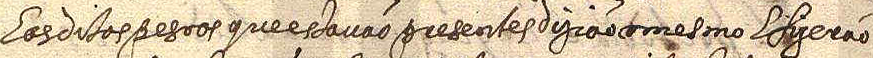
E as ditas pesoas que estauaõ presentes diziaõ o mesmo E fizeraõ
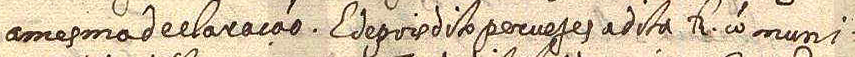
a mesma declaraçaõ. E depois dito por ueses a dita R. cōmuni
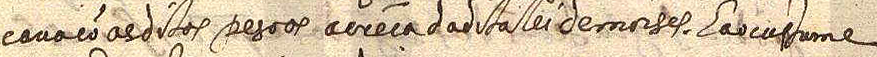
caua cō as ditas pesoas a crēça da dita lei de moises. E ao custume
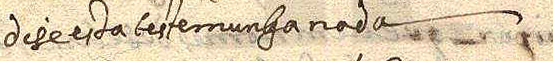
dise esta testemunha nada
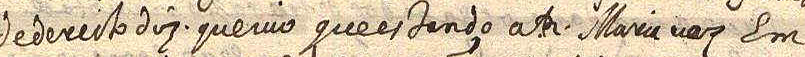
de dereito diz. que uio que estando a R. Maria uaz Em
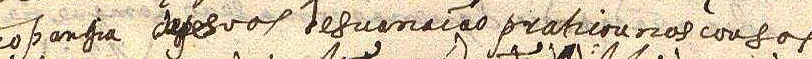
c̄opanhia de pesoas de sua naçaõ praticou nas cousas
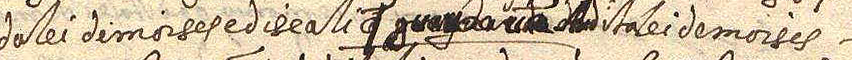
da lei de moises e dise ali q̄ guardauā A dita lei de moises
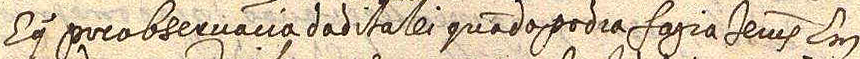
E q̄ por obseruāçia da dita lei quādo podia fazia Ieiūs Em
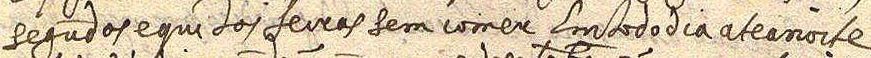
segūdas e quītas feiras sem comer Em todo dia ate a noite
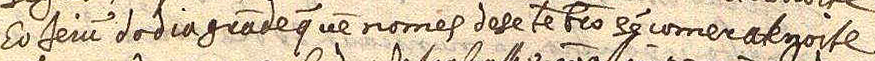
E o Ieiū do dia grāde q̄ uē no mes de setēbro sē comer ate noite
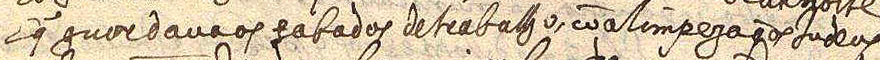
E q̄ guardaua os sabados de trabalho, cō a limpeza q̄ os Iudeus
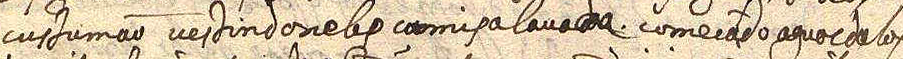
custumaõ uestindo neles camisa lauada. começādo a guardalos
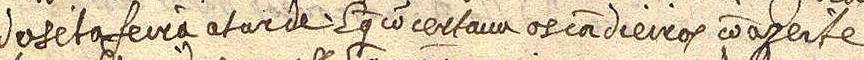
de seta feira a tarde. E q̄ cōcertaua os cādieiros c̄o azeite
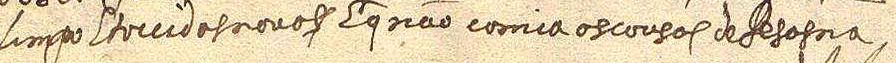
limpo E torcidas nouas E q̄ não comia as cousas defesas na
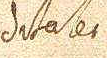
dita lei
